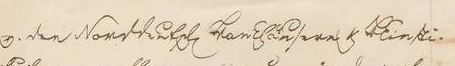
v. den Norddeutschen Bankhäusern & Bkinsti-
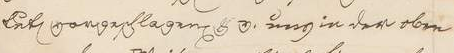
tuten vorgeschlagenen & v. uns in der oben
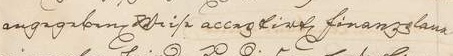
angegebenen Weise acceptirten Finanzplane
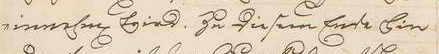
einnehmen wird. Zu diesem Ende hin
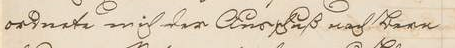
ordnete mich der Ausschuß nach Bern
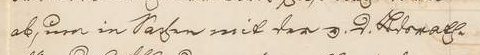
ab, um in Sachen mit der v. d. Bdsrathe
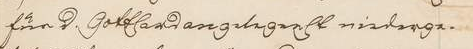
für d. Gotthardangelegenht niederge-
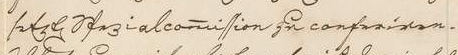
setzten Spezialcommission zu conferiren.
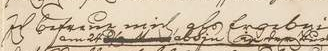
Ich befreue mich, als Ergebniß der in
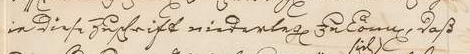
in diese Zuschrift niederlegen zu können, daß
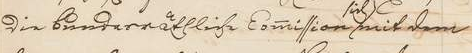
die bundesräthliche Commission sich mit dem
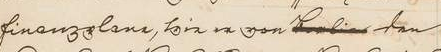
Finanzplane, wie er von Berlin den
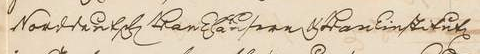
Norddeutschen Bankhäusern & Bankinstituten
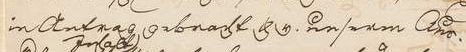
in Antrag gebracht & v. unserm Aus-
